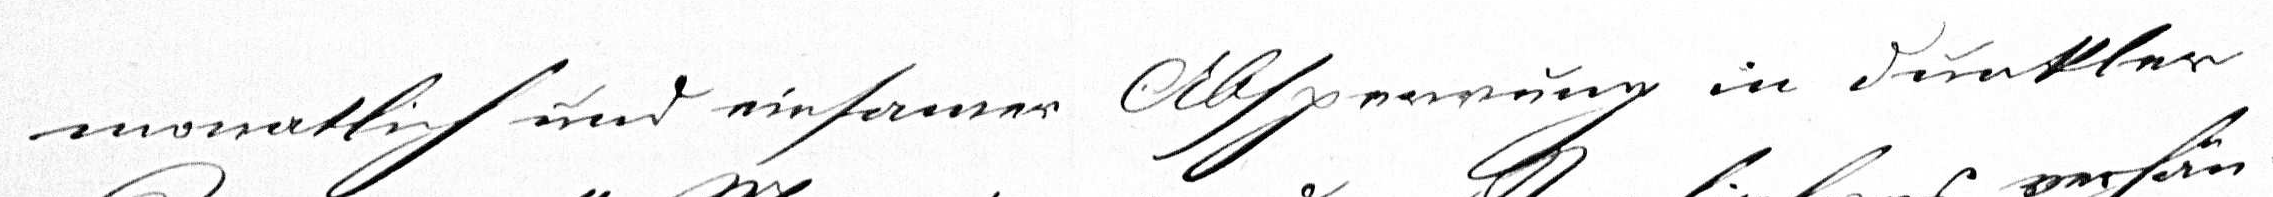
monatlich und einsamer Absperrung in dunkler
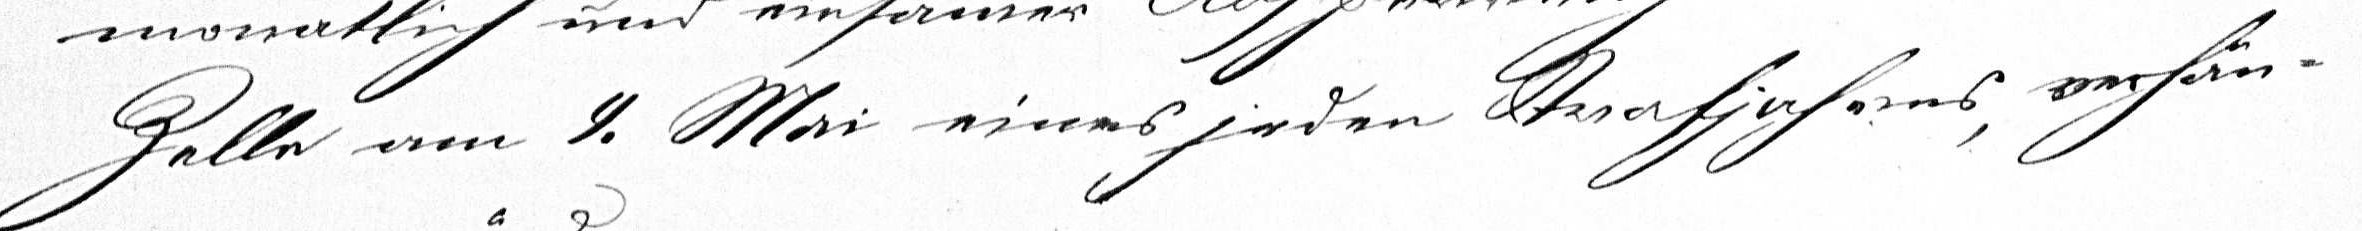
Zelle am 4. Mai eines jeden Strafjahres, verhän¬
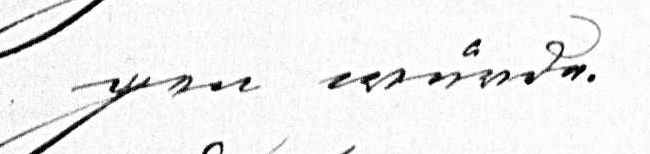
gen würde.
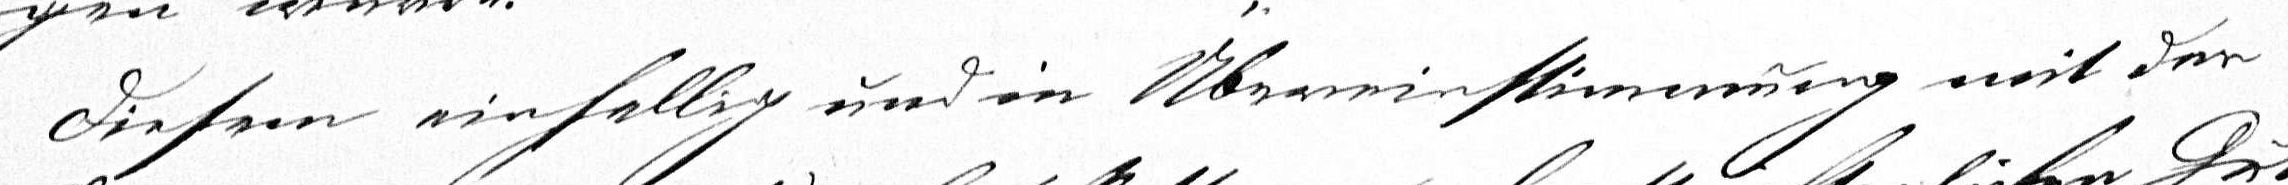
Diesem einhellig und in Übereinstimmung mit den
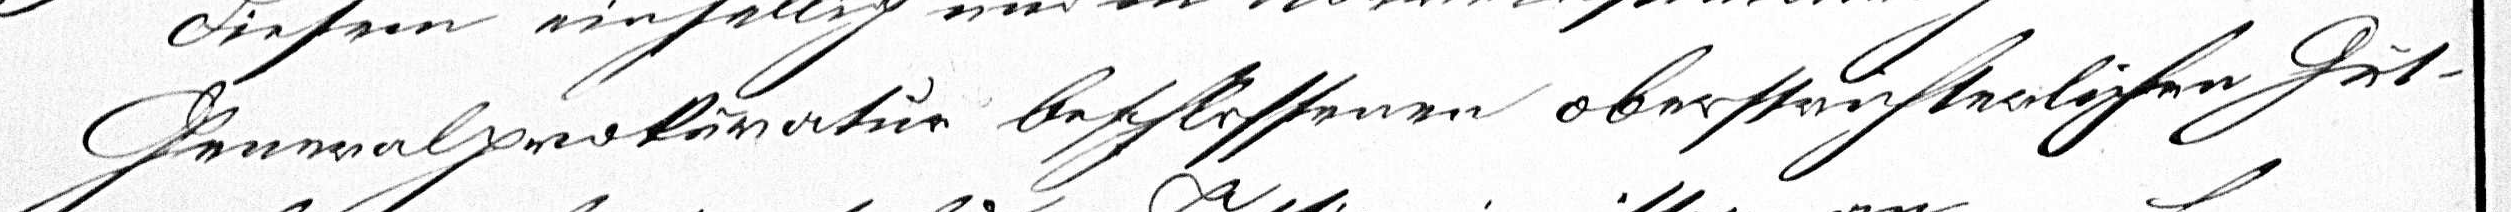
Generalprokuratur beschlossenen oberstrichterlichen Gut¬
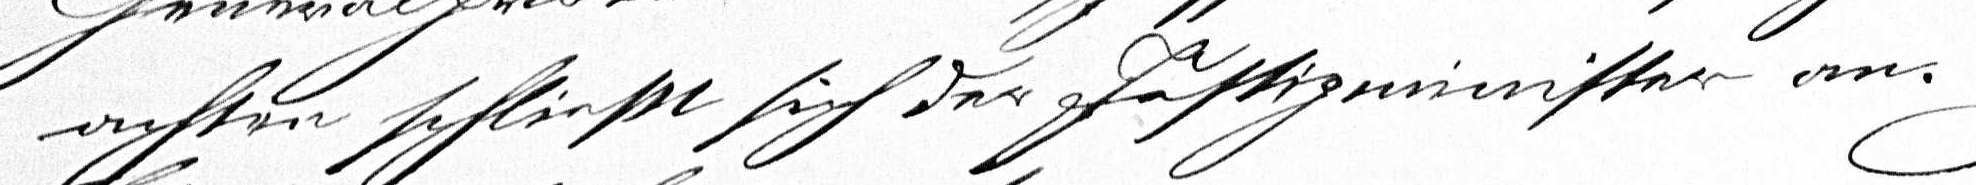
achten schließt sich der Justizminister an.
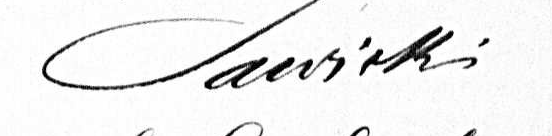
Sawicki
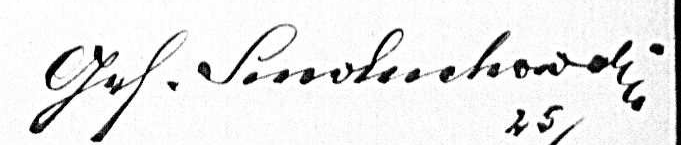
Ges. Smolnchowski
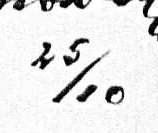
25/10
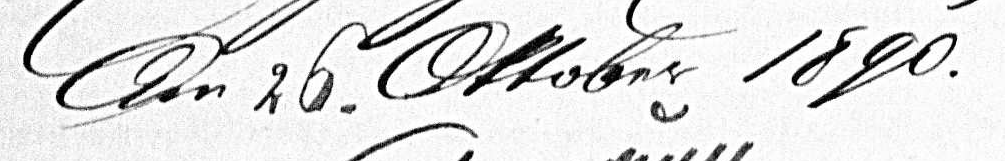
Am 26. Oktober 1890.
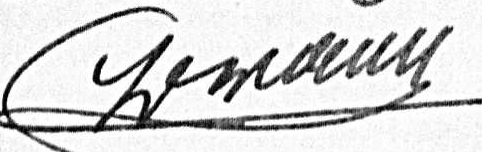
Braun
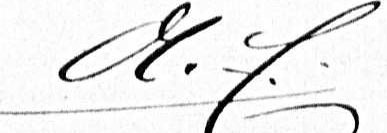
A. E.
